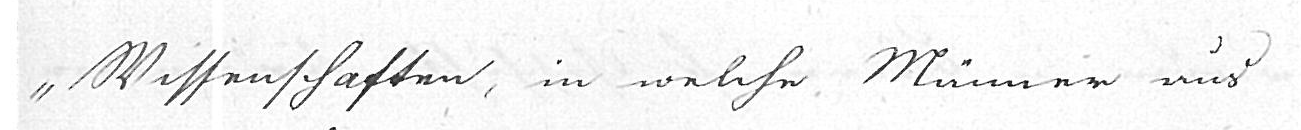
"Wissenschaften, in welche Männer aus
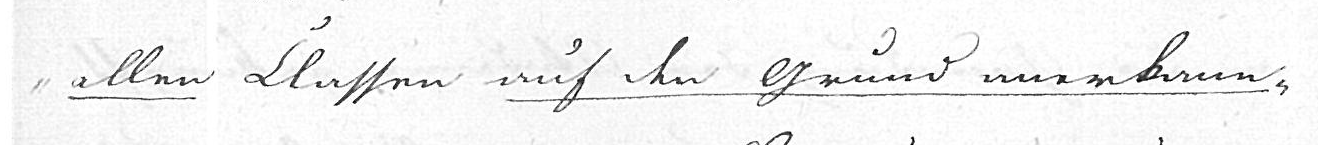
"allen Classen auf den Grund anerkann-
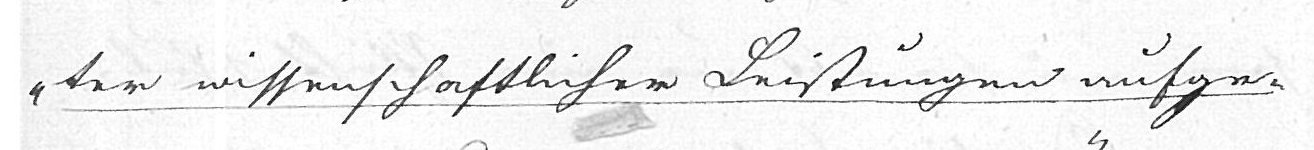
"ter wissenschaftlicher Leistungen aufge-
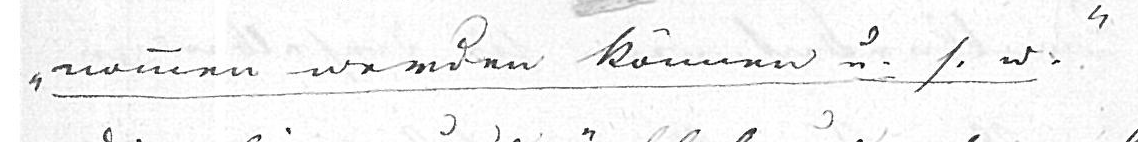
"nommen werden können u. s. w."
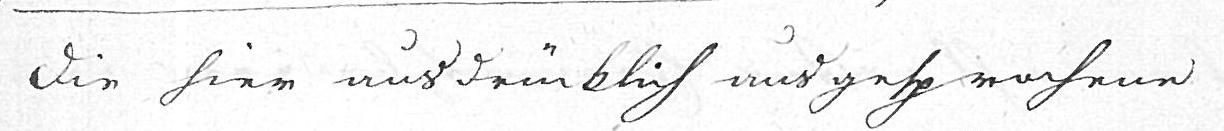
Die hier ausdrücklich ausgesprochene
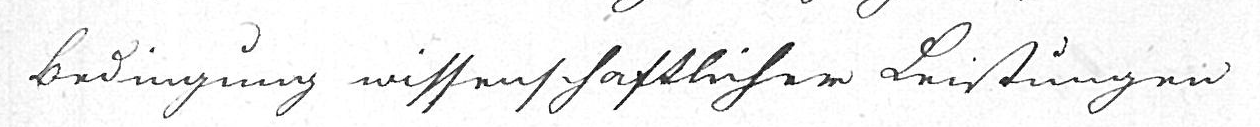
bedingung wissenschaftlicher Leistungen
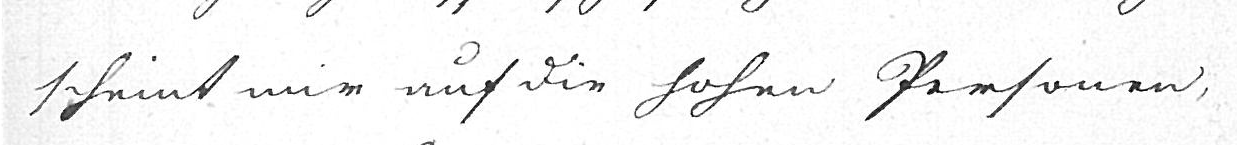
scheint mir auf die hohen Personen,
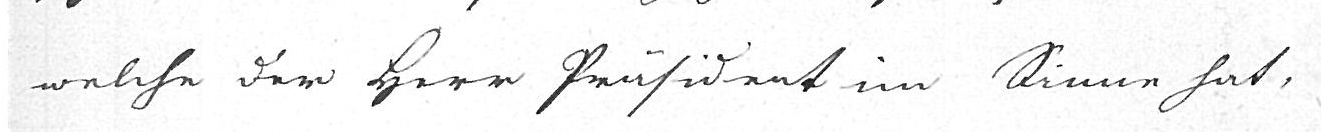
welche der Herr Präsident im Sinne hat,
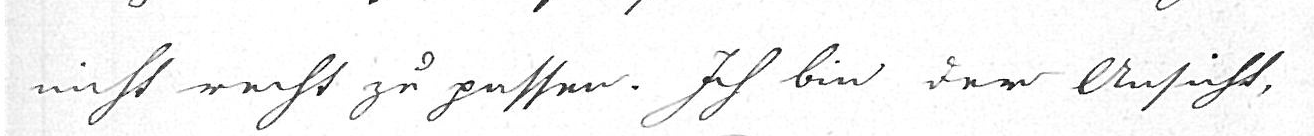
nicht recht zu passen. Ich bin der Ansicht,
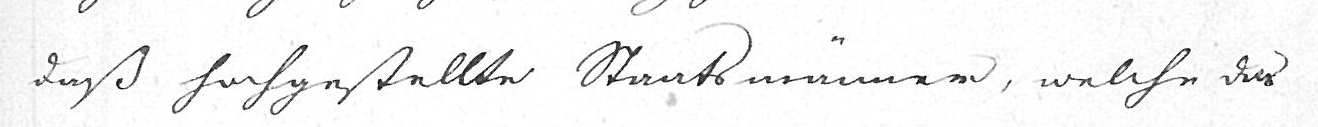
daß hochgestellte Staatsmänner, welche das
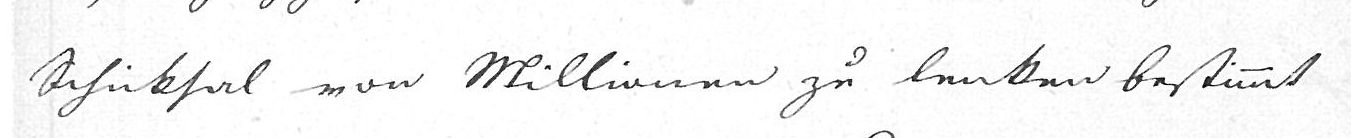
Schicksal von Millionen zu lenken bestimmt
